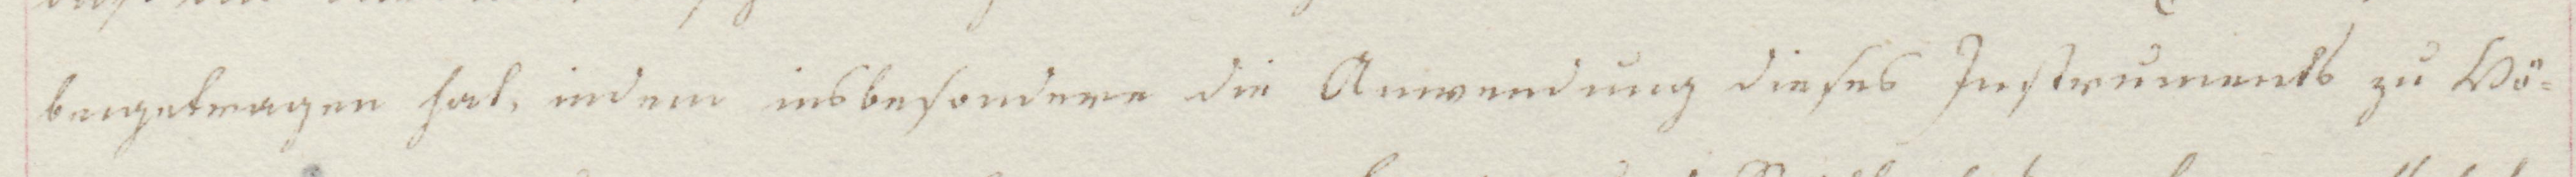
beigetragen hat, indem insbesondere die Anwendung dieses Instruments zu Hö-
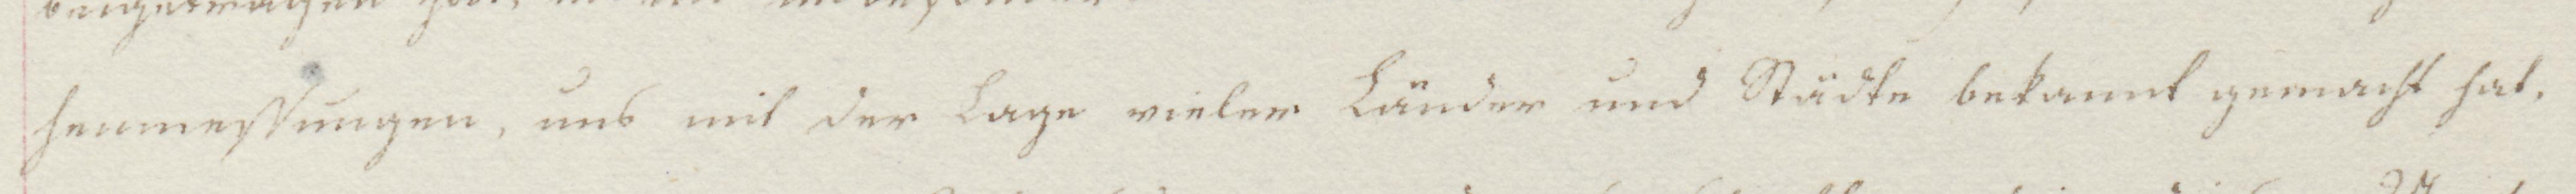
henbestimmungen, uns mit der Lage vieler Länder und Städte bekannt gemacht hat,
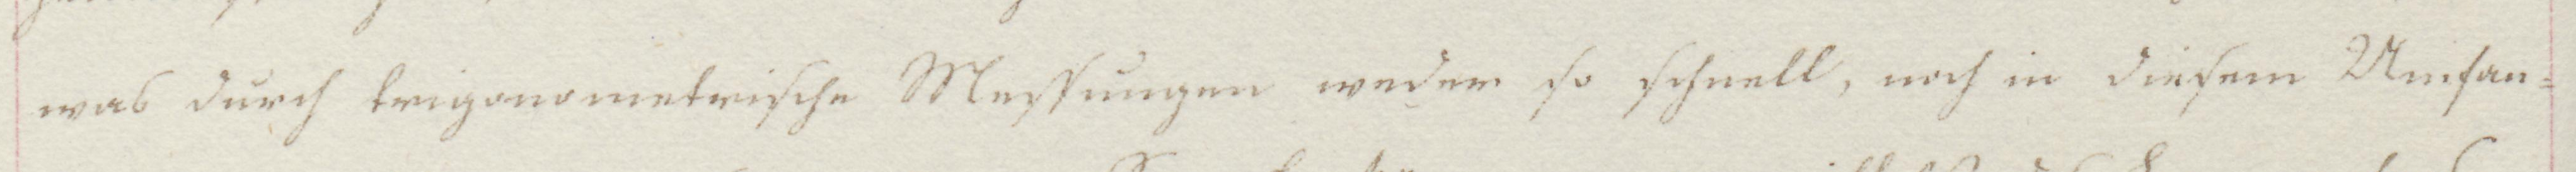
was durch trigonometrische Messungen weder so schnell, noch in diesem Umfan-
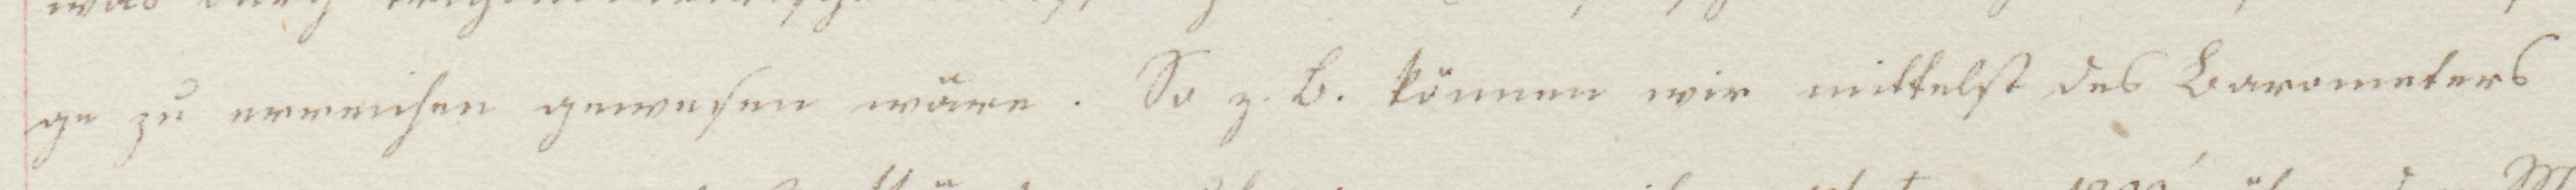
ge zu erreichen gewesen wäre. So z. B. können wir mittelst des Barometers
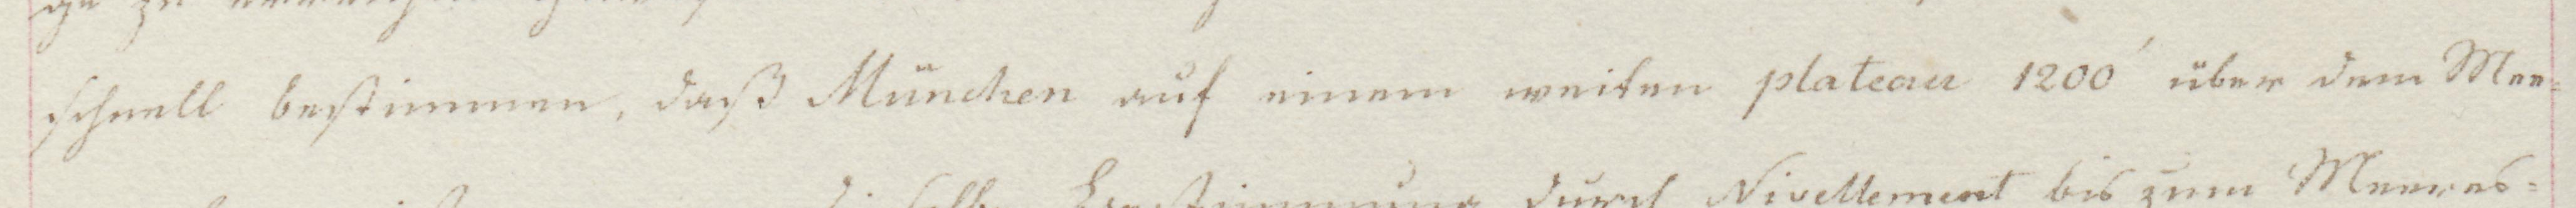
schnell bestimmen, daß München auf einem weiten plateau 1200′ über dem Mee-
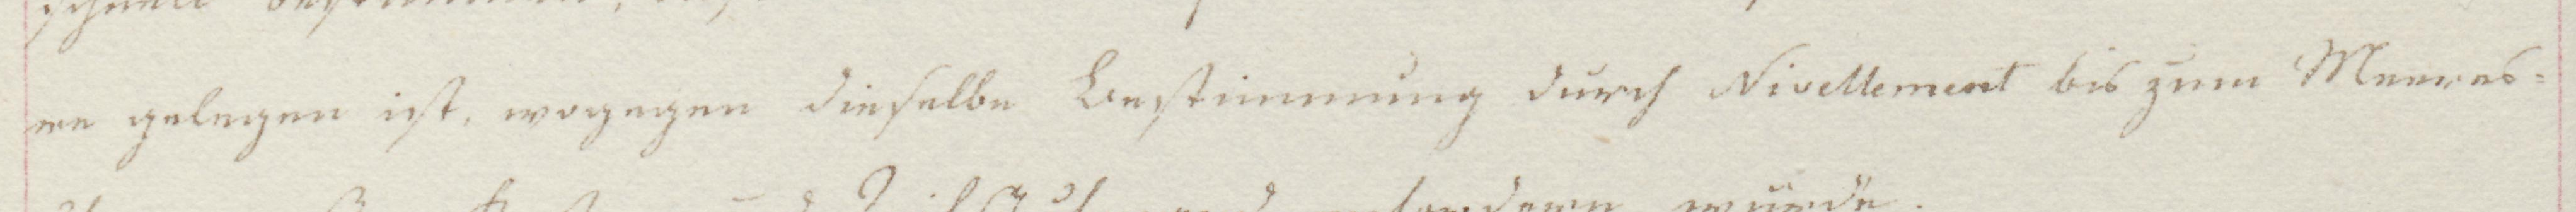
re gelegen ist, wogegen dieselbe Bestimmung durch Nivellement bis zum Meeres-
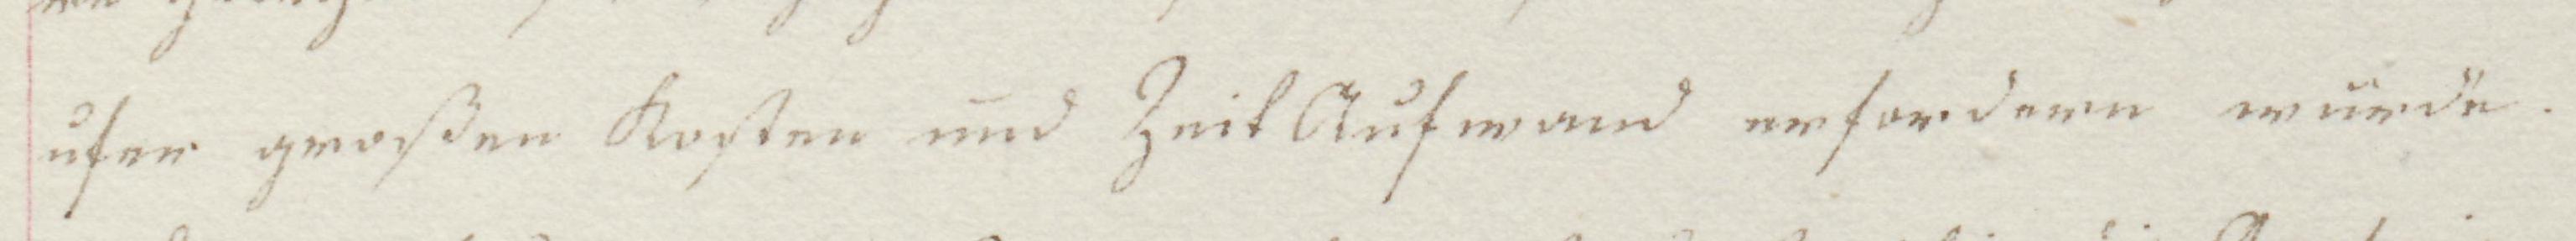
ufer großen Kosten und Zeit Aufwand erfordern würde.
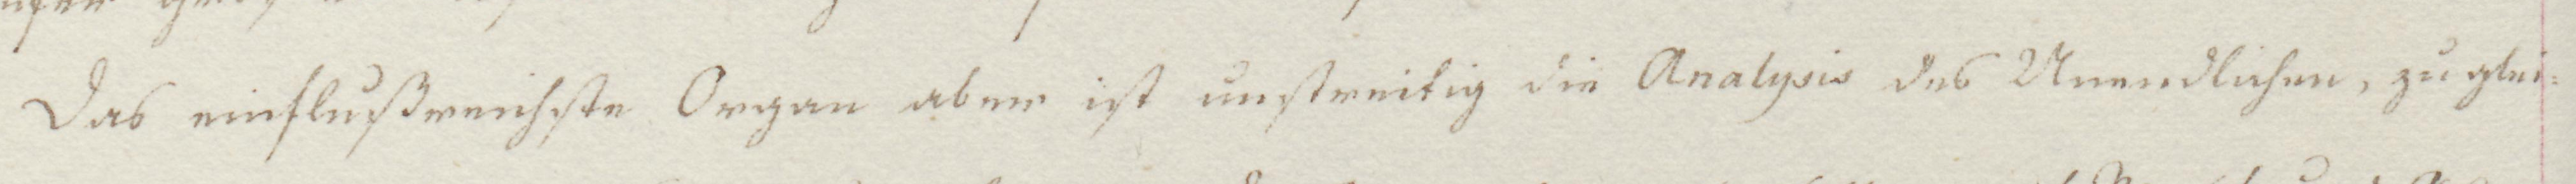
Das einflußreichste Organ aber ist unstreitig die Analysis des Unendlichen, zu glei-
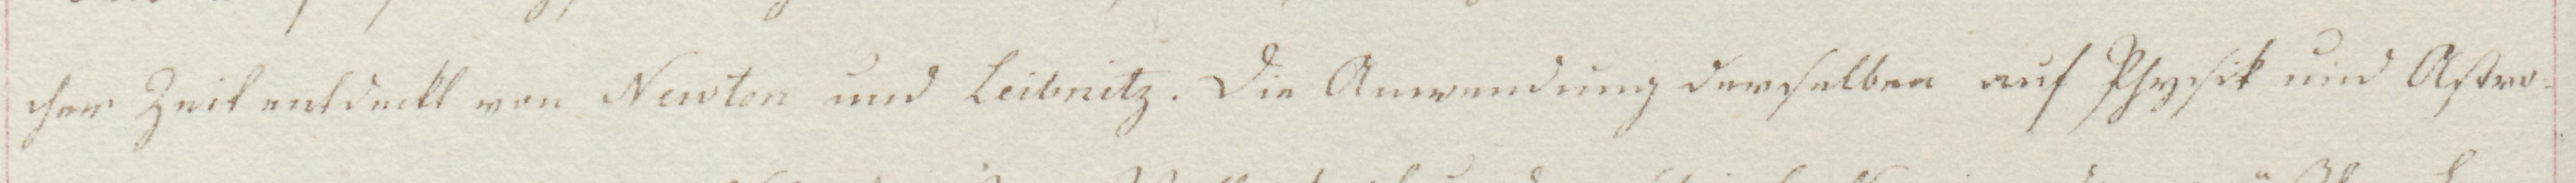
cher Zeit entdeckt von Newton und Leibnitz. Die Anwendung derselben auf Physik und Astro-
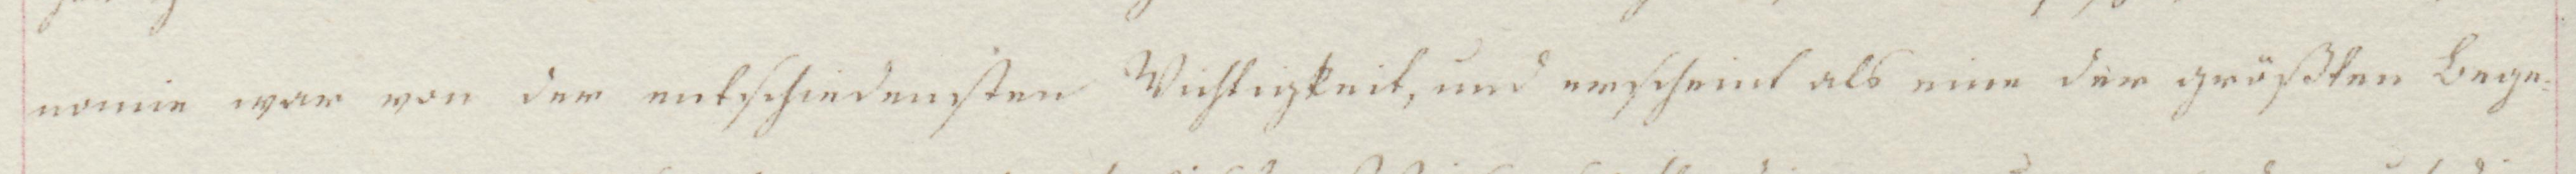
nomie war von der entschiedensten Wichtigkeit, und erscheint als eine der größten Bege-
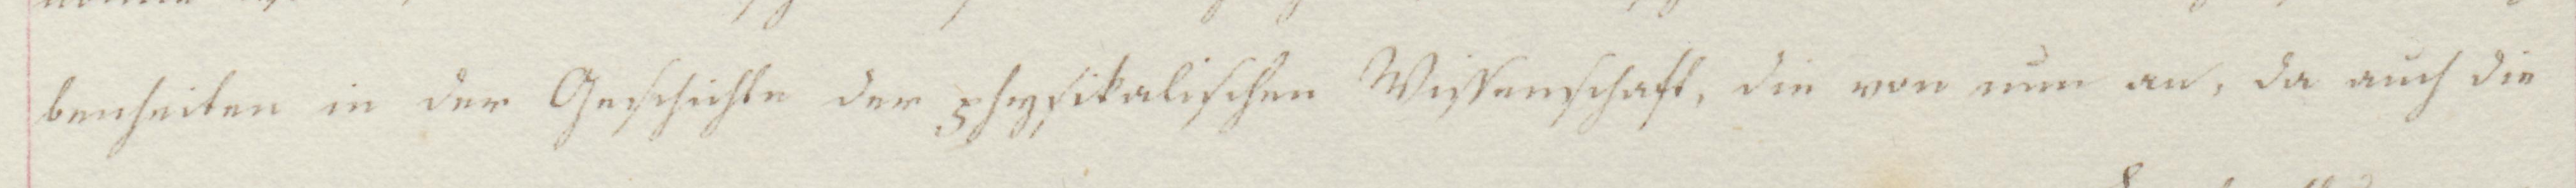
benheiten in der Geschichte der physikalischen Wissenschaft, die von nun an, da auch die
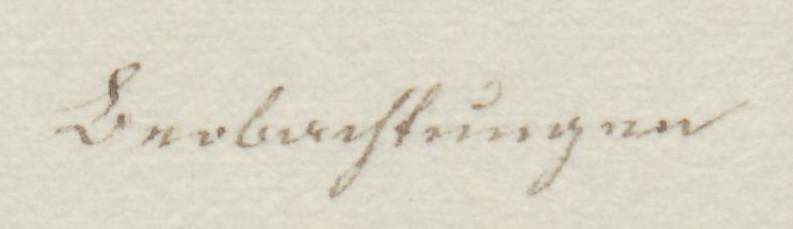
Beobachtungen
